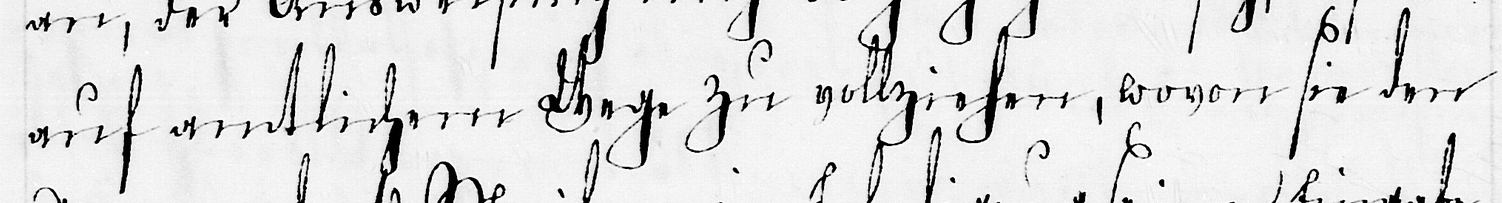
auf amtlichem Wege zu vollziehen, wovon sie den
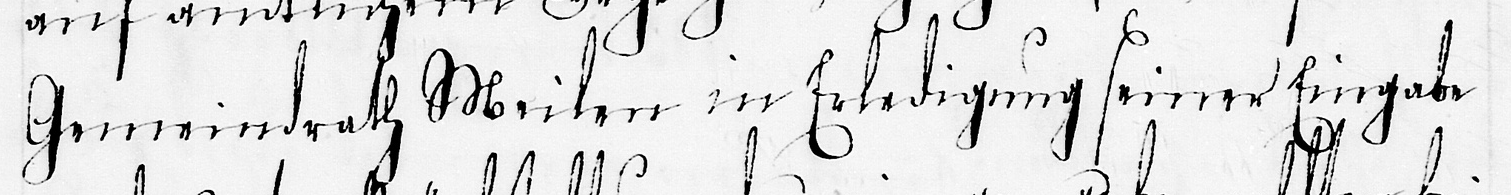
Gemeindrath Meilen in Erledigung seiner Eingabe
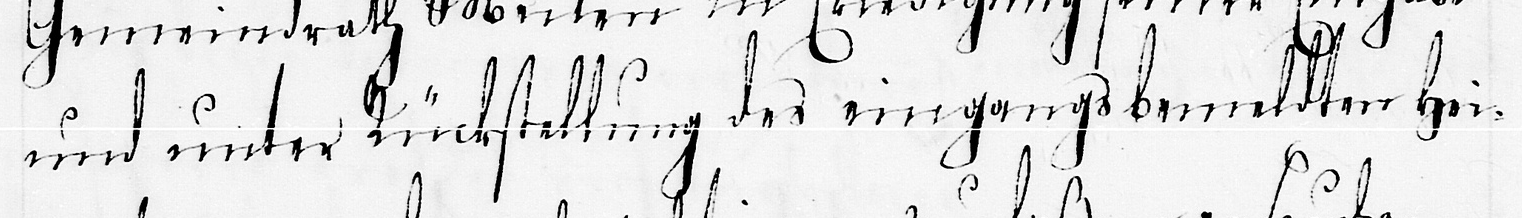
und unter Rückstellung des eingangs bemeldten Hei¬
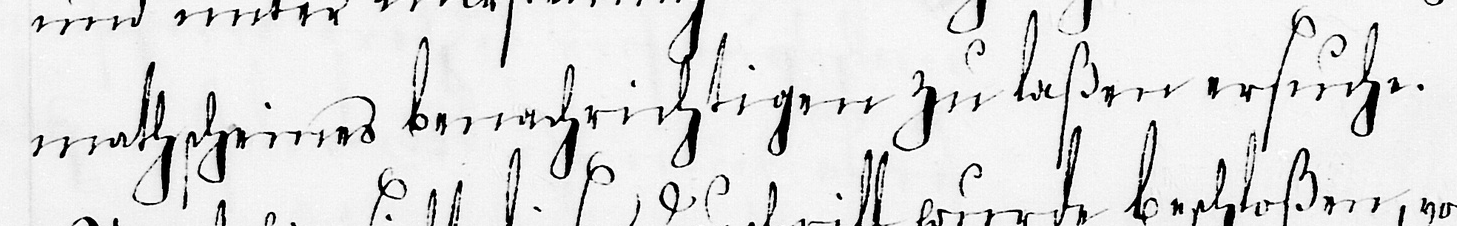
mathscheines benachrichtigen zu laßen ersuche.
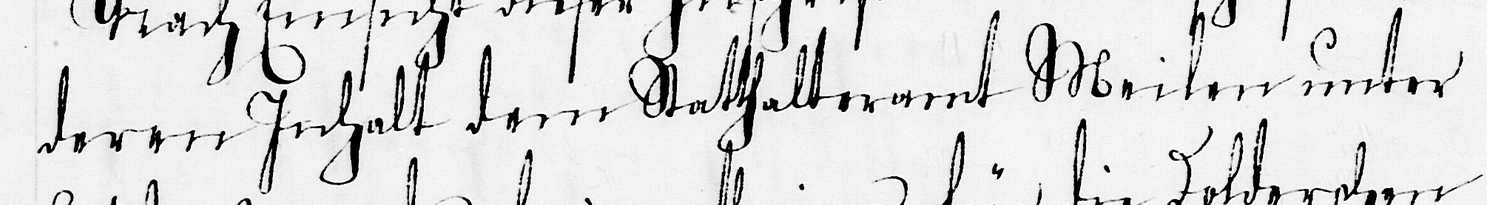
deren Inhalt dem Statthalteramt Meilen unter
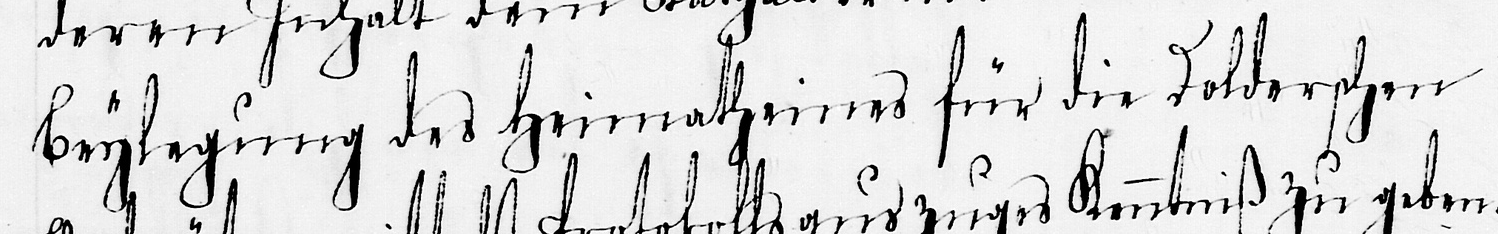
Beylegung des Heimathscheines für die Dolderschen
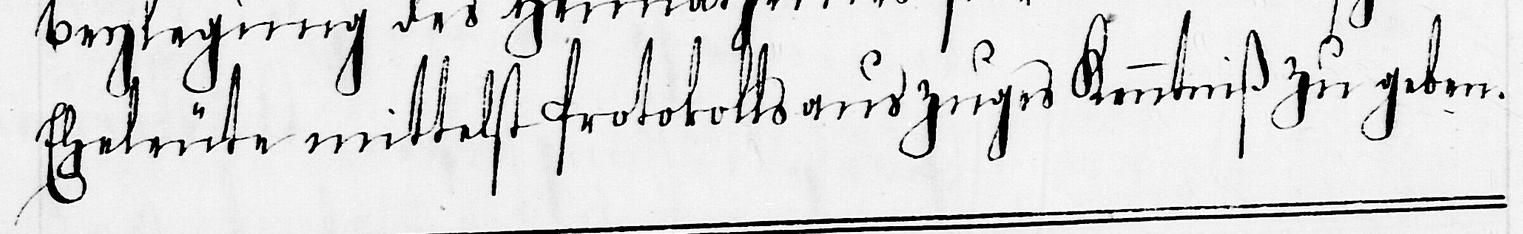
Eheleute mittelst Protokollsauszuges Kenntniß zu geben.
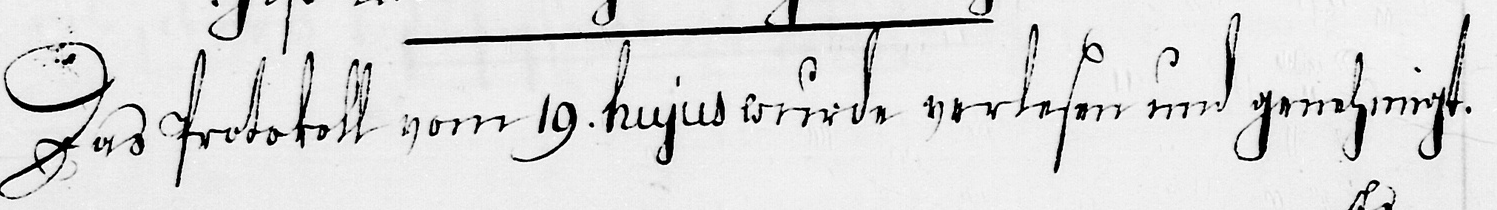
Das Protokoll vom 19. hujus wurde verlesen und genehmigt.
